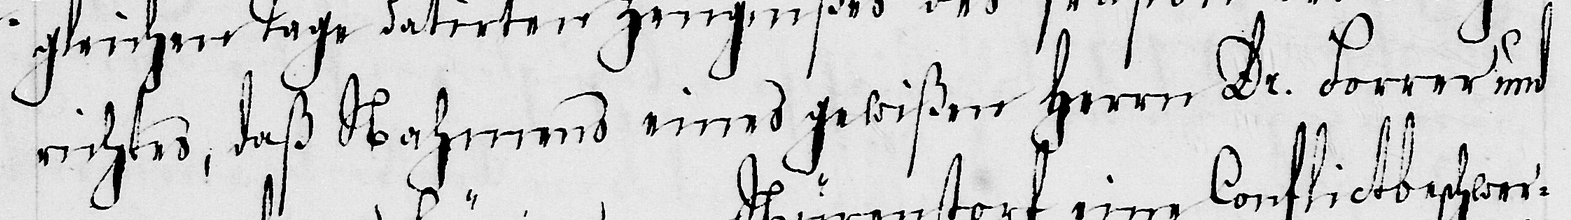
richtes, daß Nahmens eines gewißen Herrn Dr. Forrer und
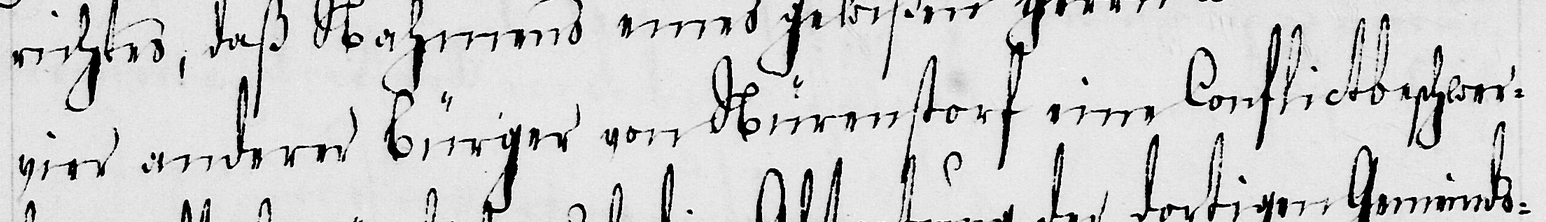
vier anderer Bürger von Nürenstorf eine Conflictbeschwer¬
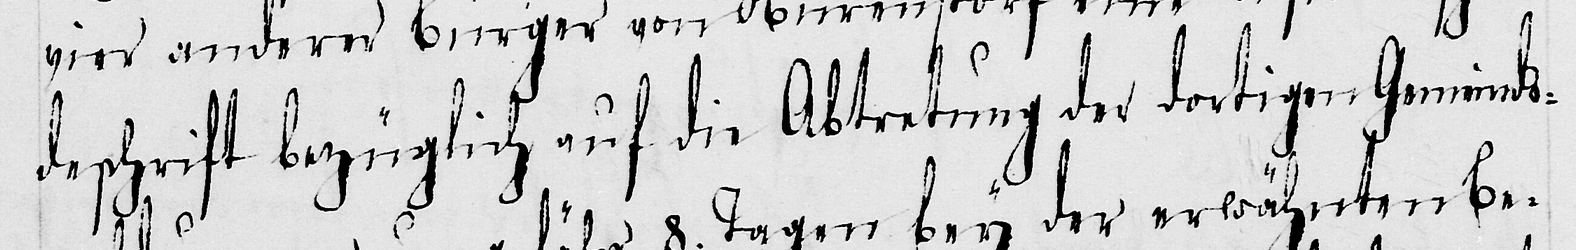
deschrift bezüglich auf die Abtretung der dortigen Gemeinds¬
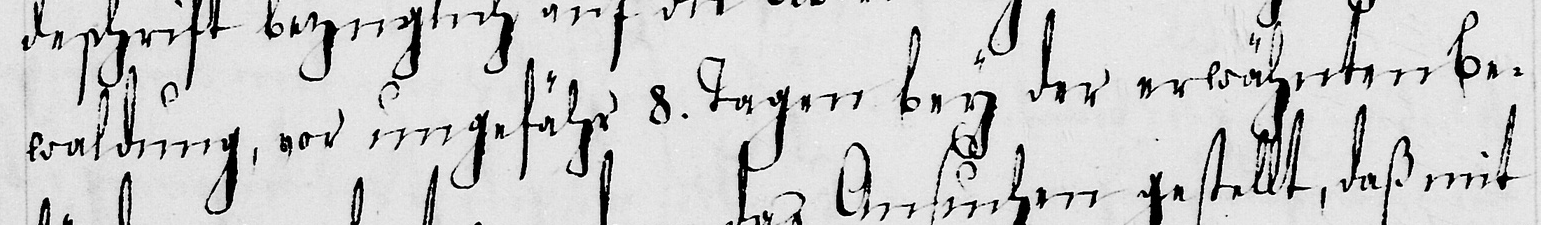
waldung, vor ungefähr 8. Tagen bey der erwähnten Be¬
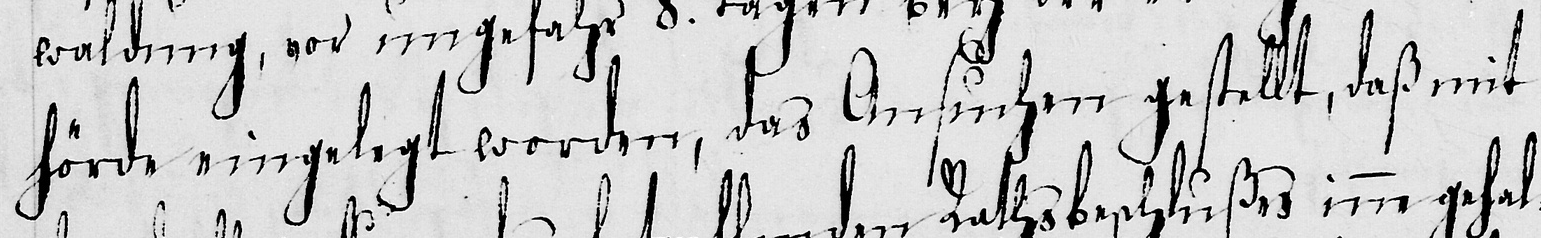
hörde eingelegt worden, das Ansuchen gestellt, das mit
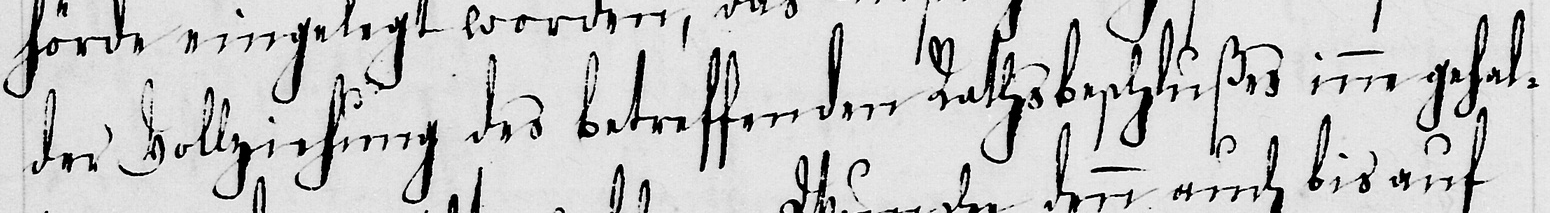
der Vollziehung des betreffenden Rathsbeschlußes inne ge¬
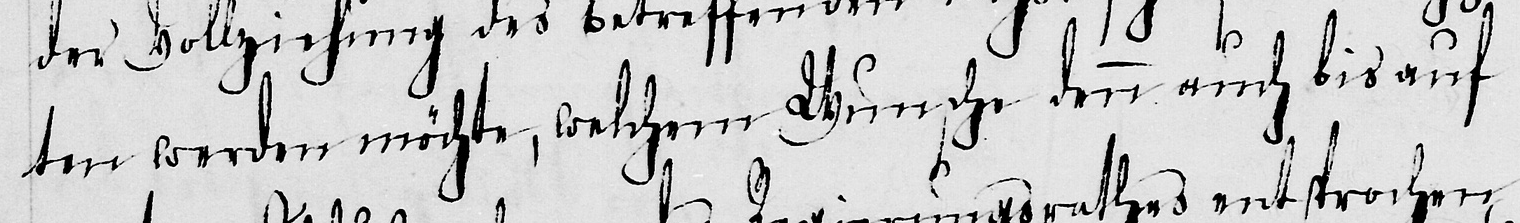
lten werden möchte, welchem Wunsche denn auch bis auf
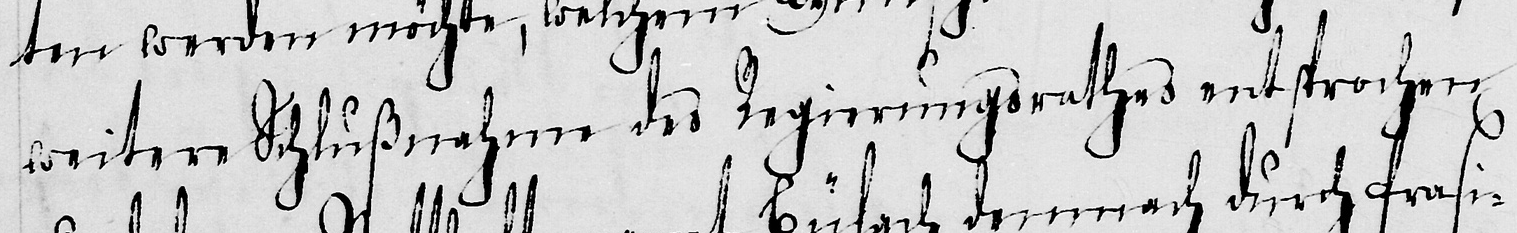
weitere Schlußnahme des Regierungsrathes entsprochen
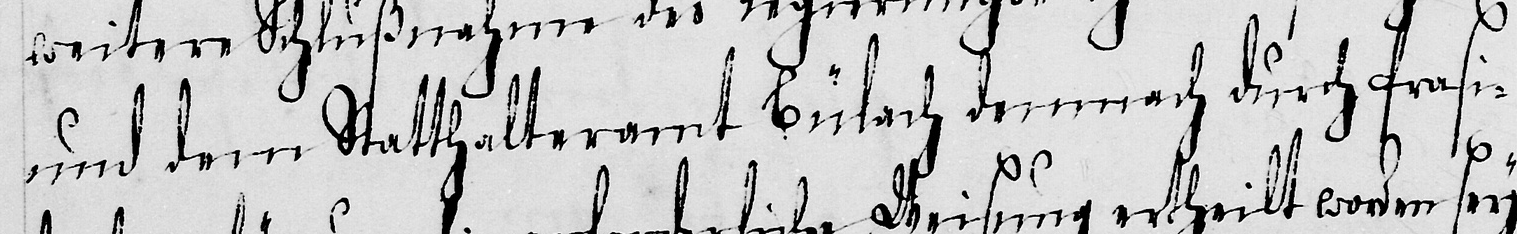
und dem Statthalteramt Bülach demnach durch Präsi¬
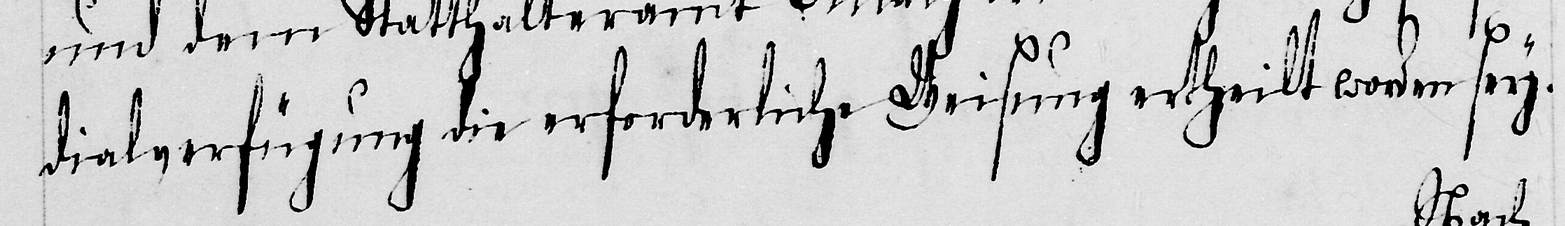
dialverfügung die erforderliche Weisung ertheilt worden sey.
